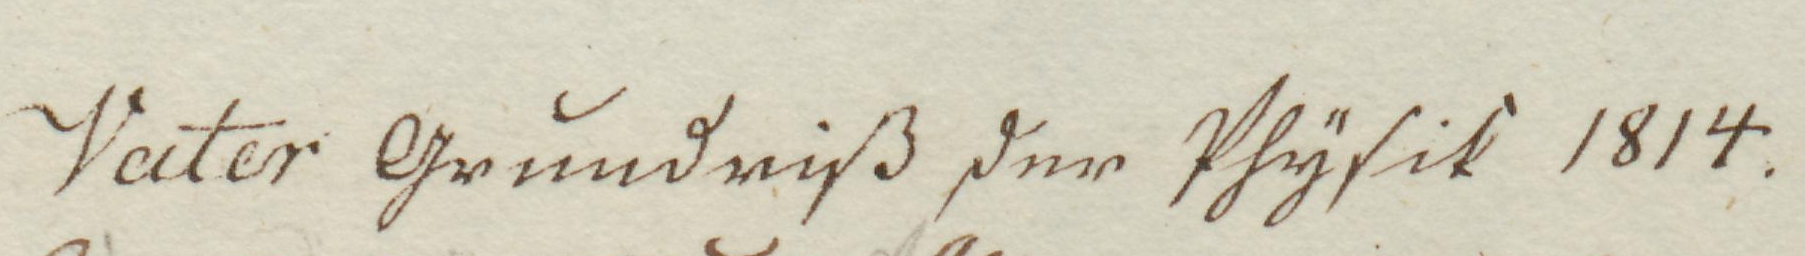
Vater Grundriß der Phÿsik 1814.
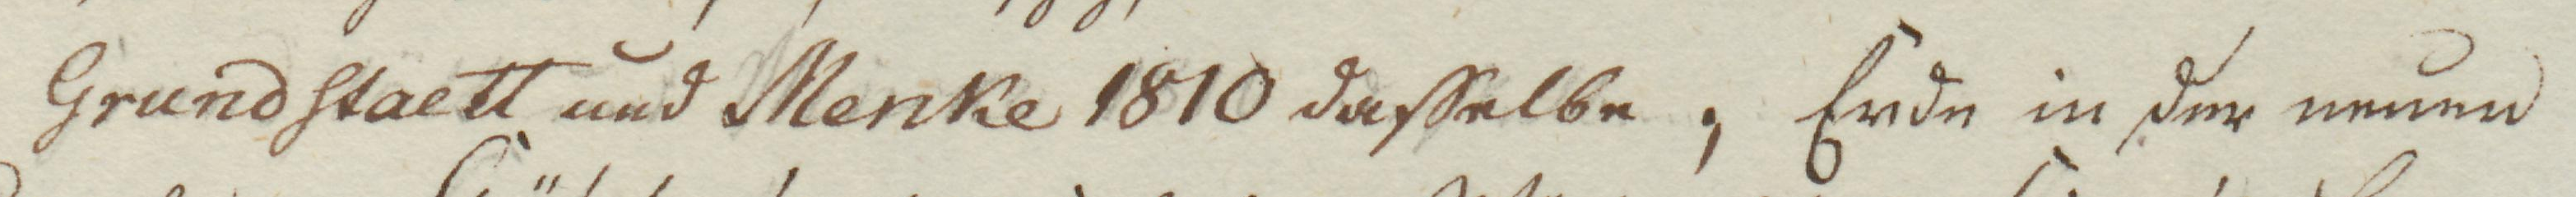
Grundstaett und Menke 1810 dasselbe; Erde in der neuen
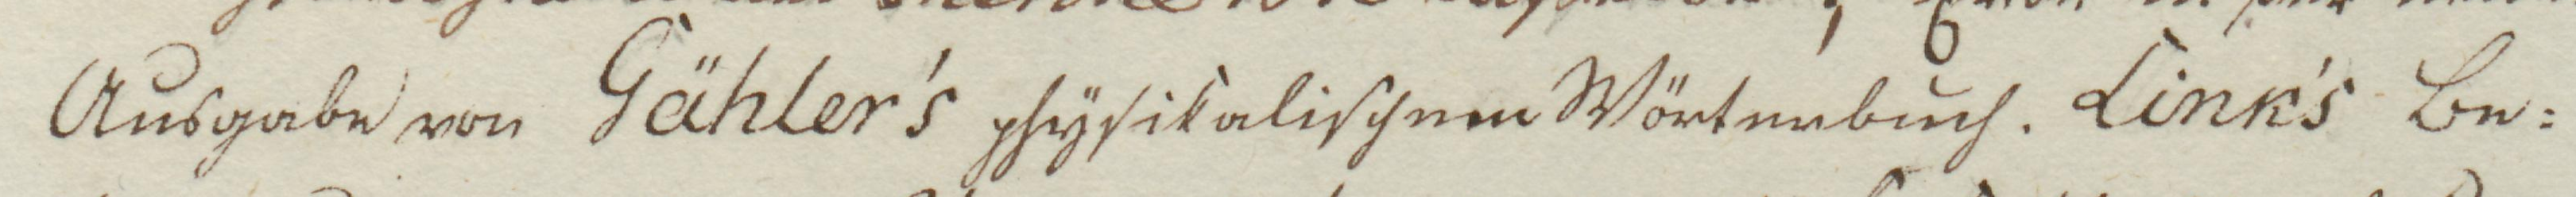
Ausgabe von Gähler's phÿsikalischem Wörterbuch. Link's Be-
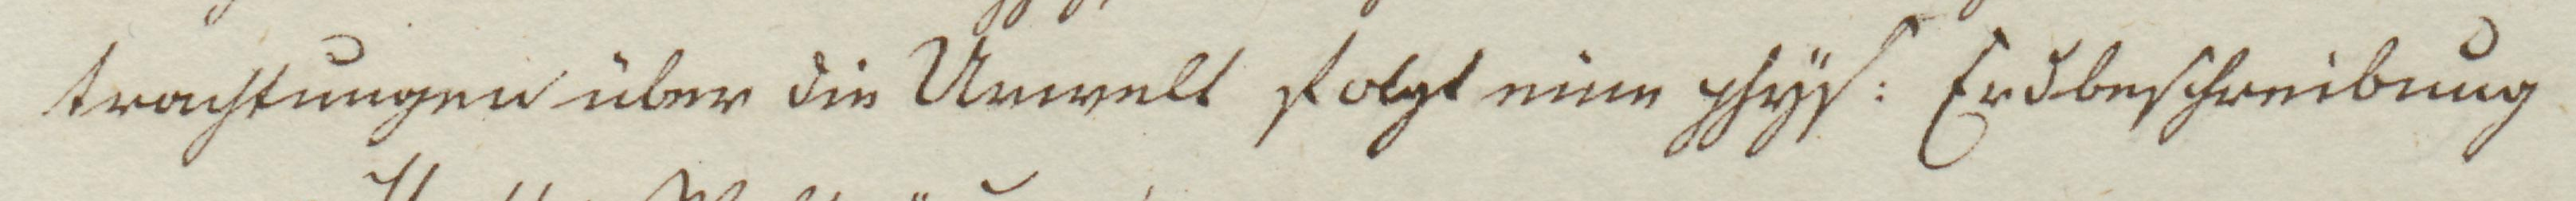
trachtungen über die Urwelt folgt eine phÿs. Erdbeschreibung
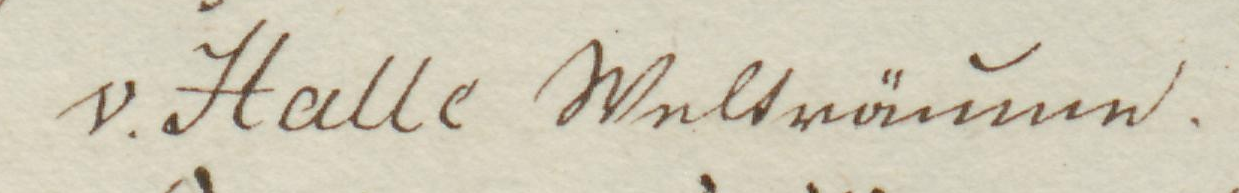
v. Halle Welträume.
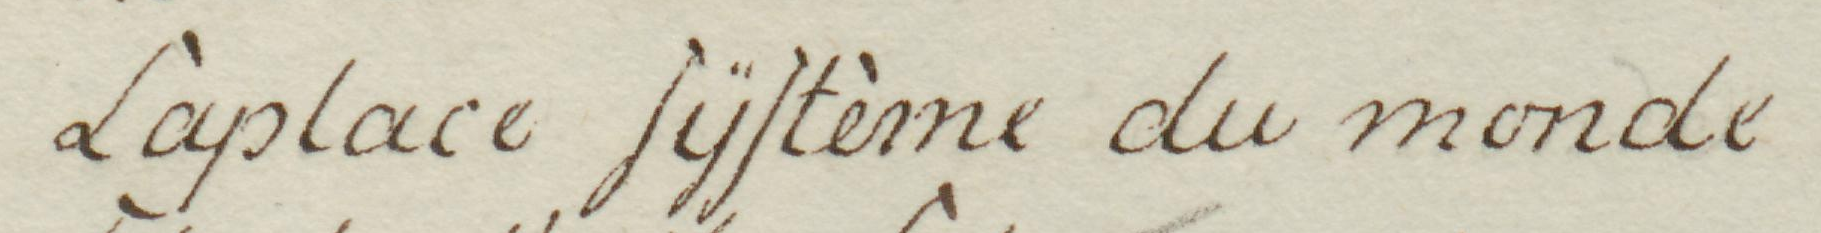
Laplace sÿsteme du monde
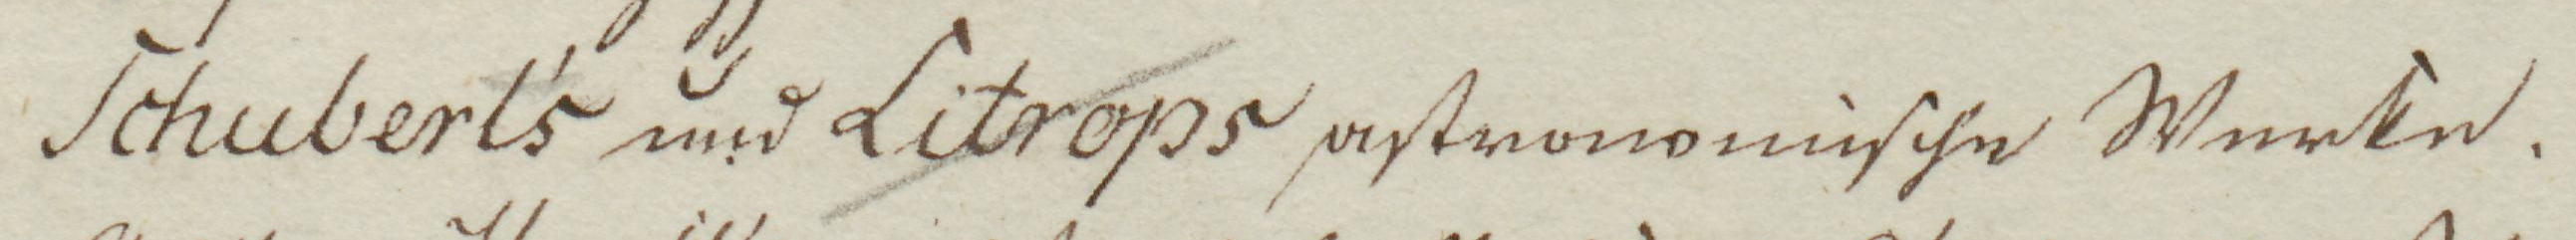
Schuberlt's u.nd Litrops astronomische Werke.
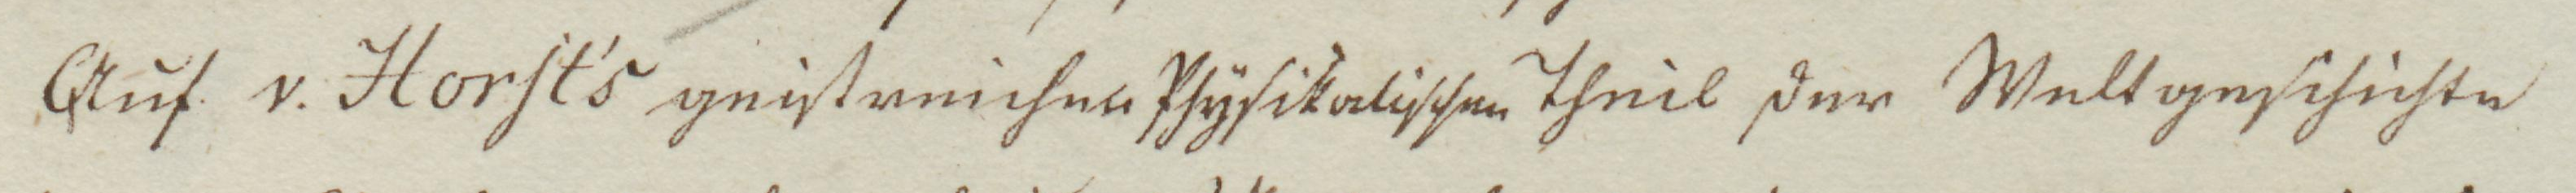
Auf v. Horst's geistreichen Phÿsikalischen Theil der Weltgeschichte
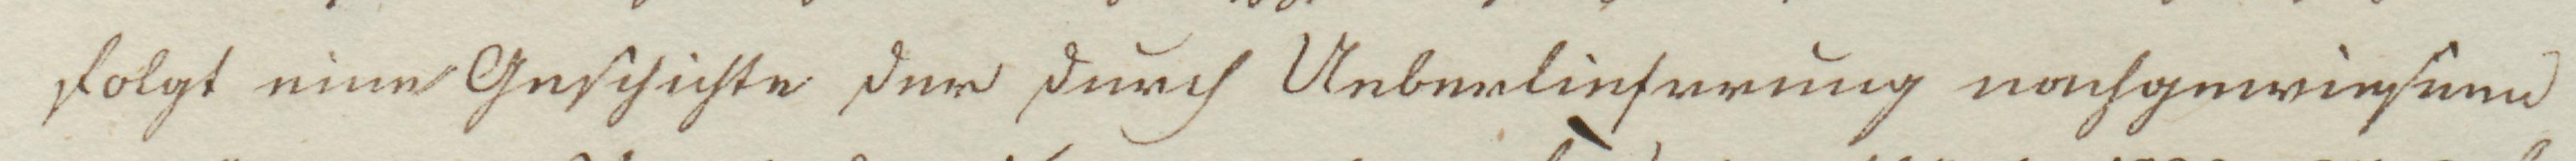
folgt eine Geschichte der durch Ueberlieferung nachgewiesenen
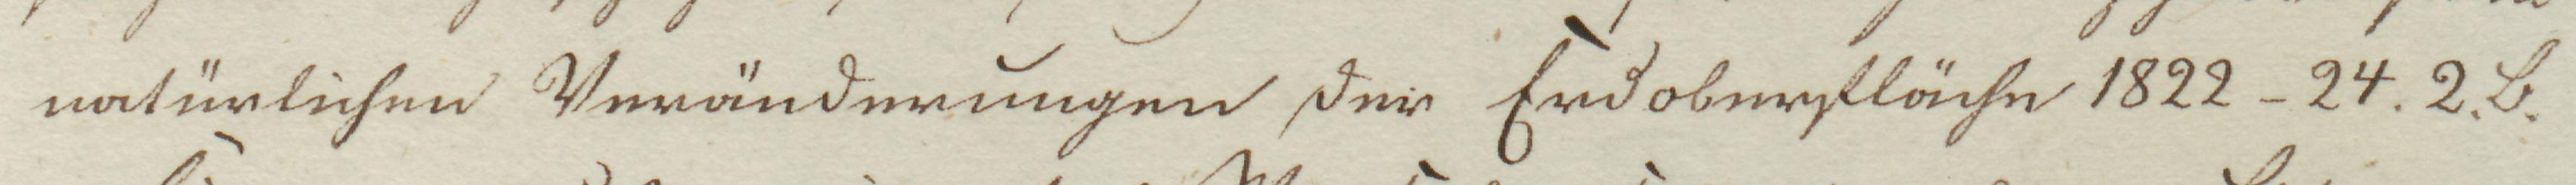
natürlichen Veränderungen der Erdoberfläche 1822–24. 2 B.
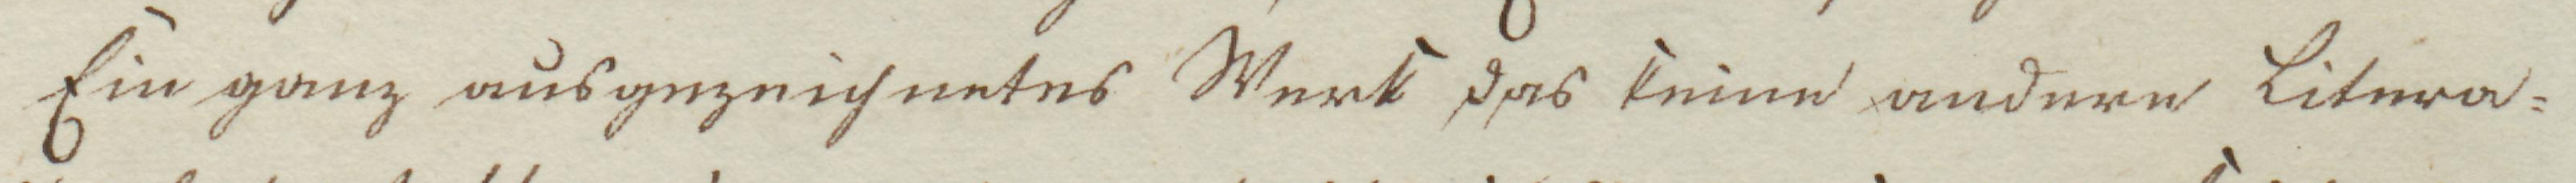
Ein ganz ausgezeichnetes Werk das keine andere Litera-
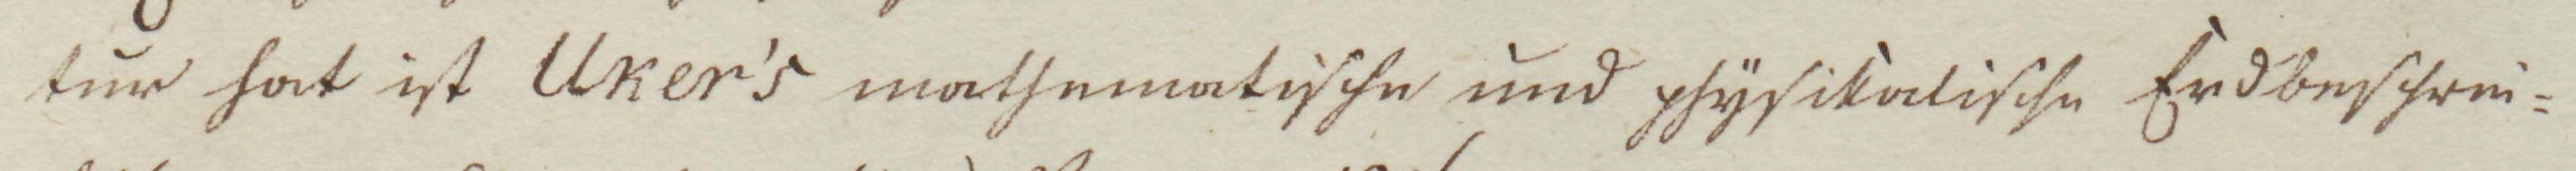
tur hat ist Uker's mathematische und phÿsikalische Erdbeschrei-
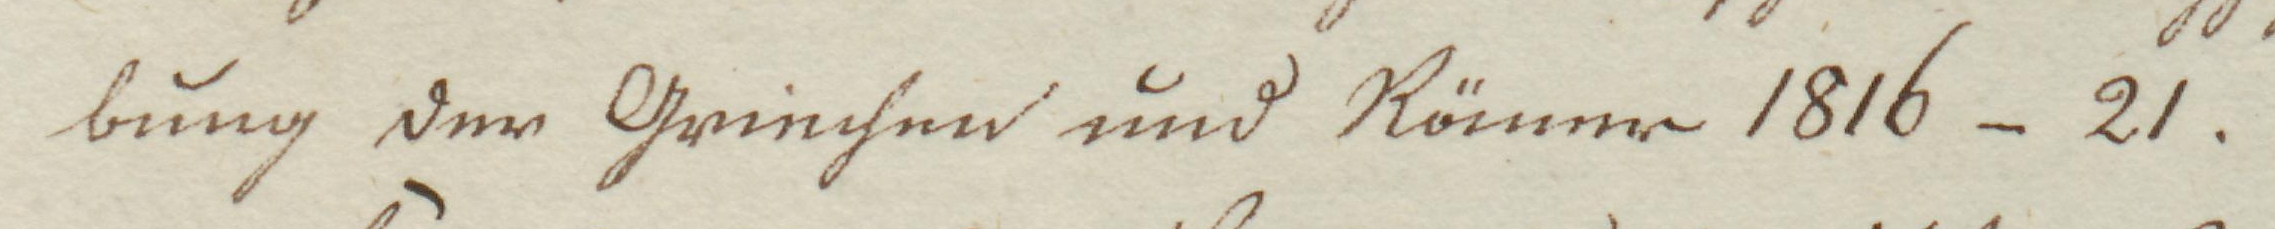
bung der Griechen und Römer 1816–21.
